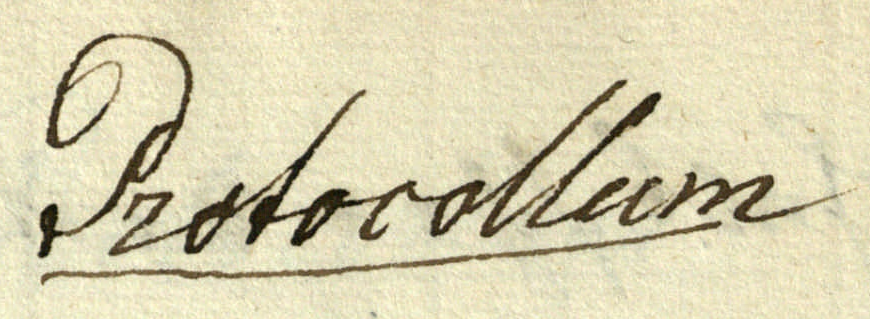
Protocollum
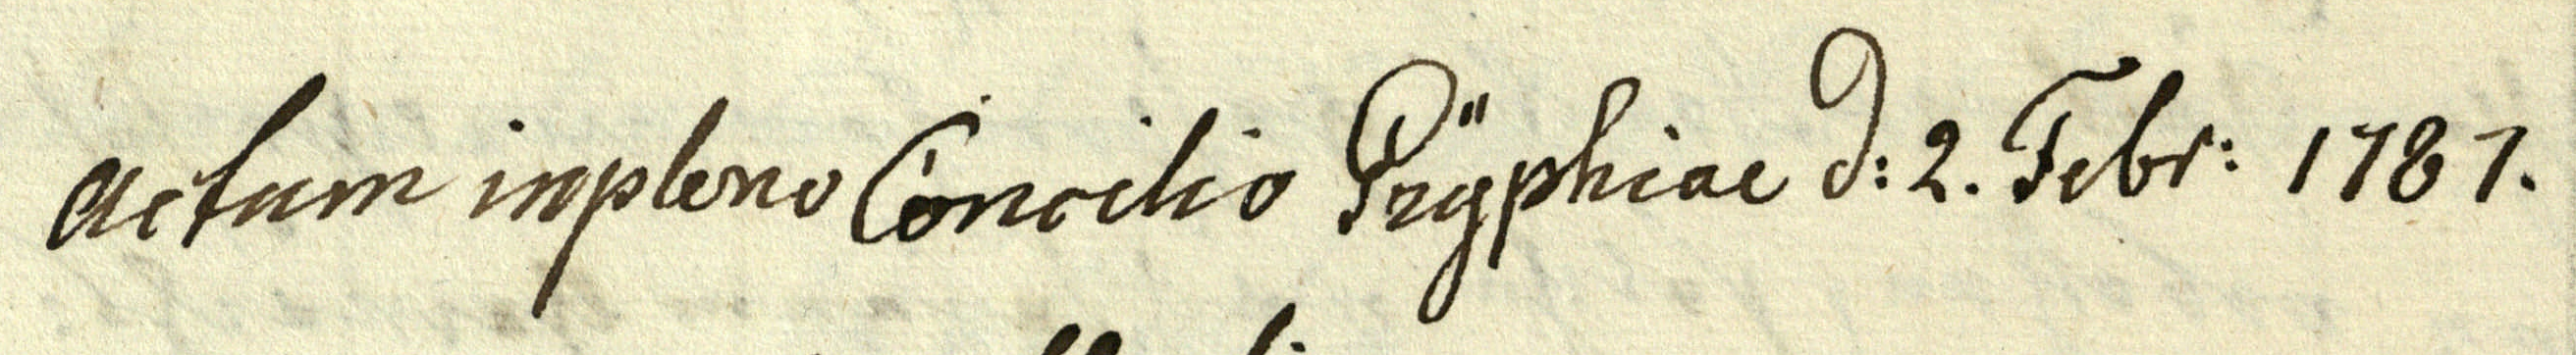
Actum in pleno Concilio Grÿphiae d 2. Febr. 1787.
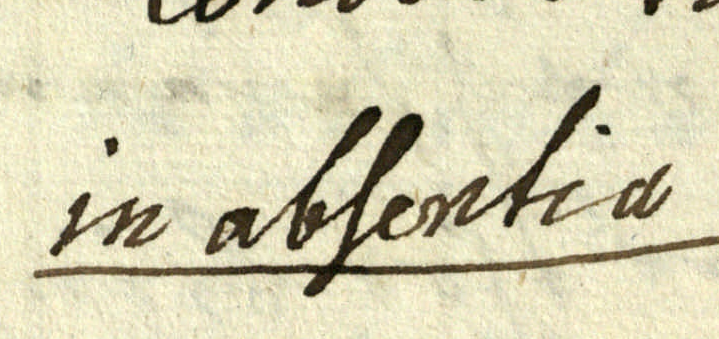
in absentia
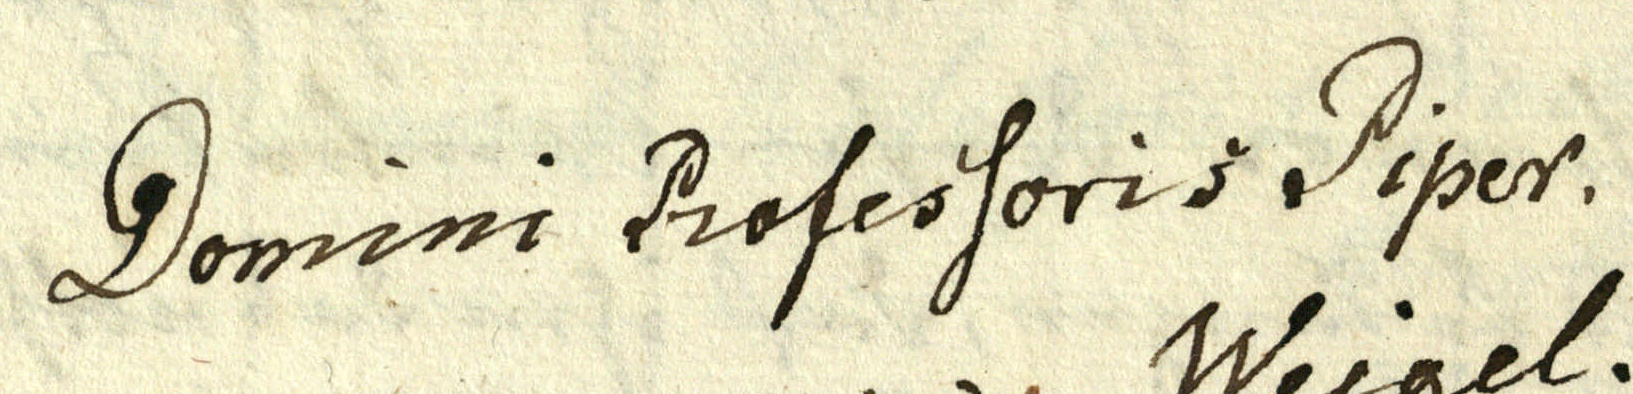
Domini Professoris Piper.
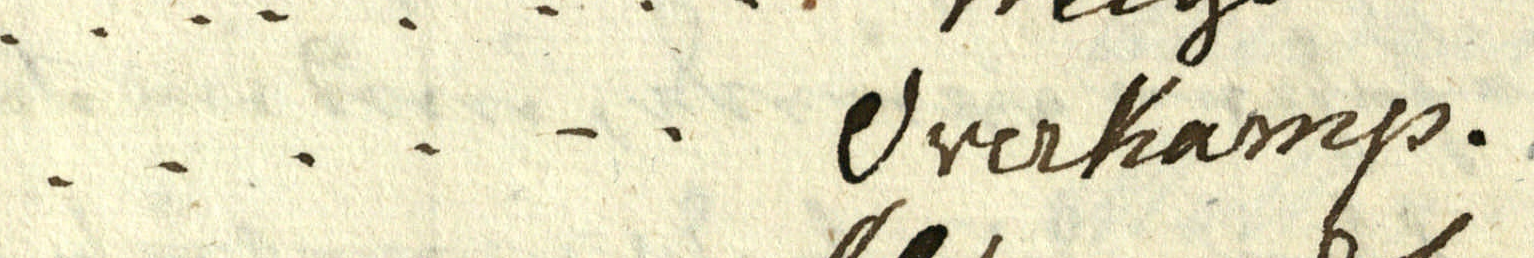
Overkamp.
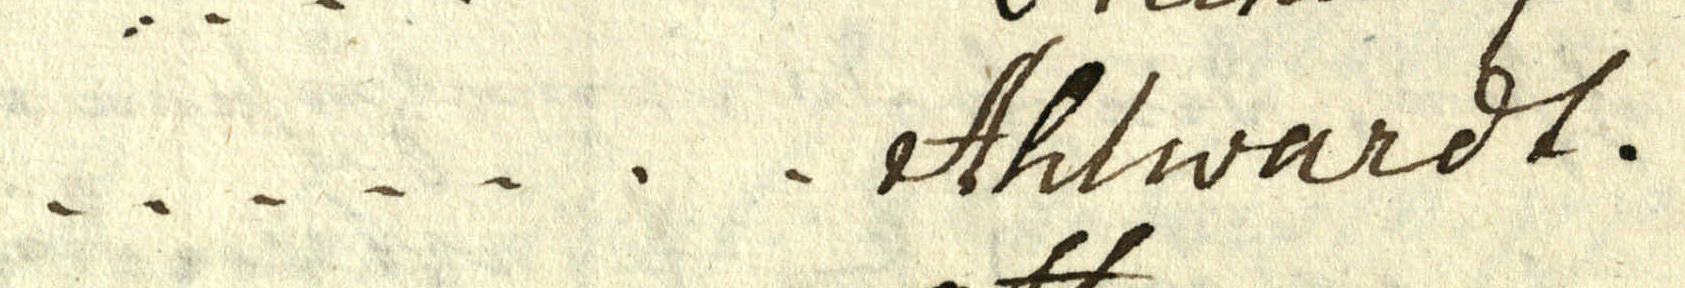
Ahlwardt.
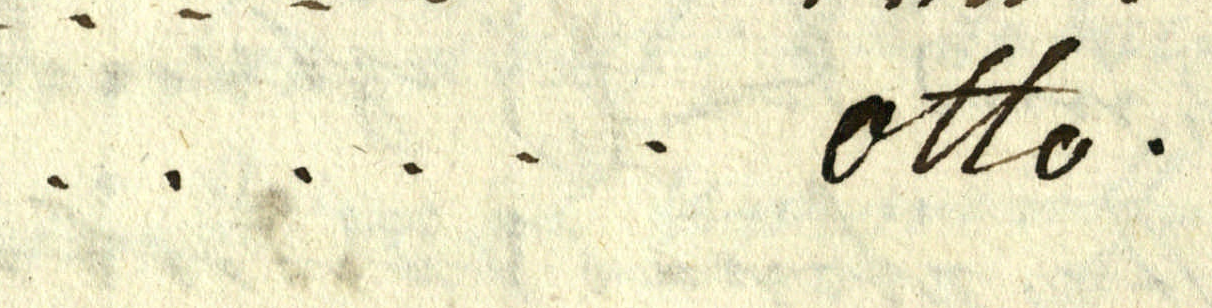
Otto.
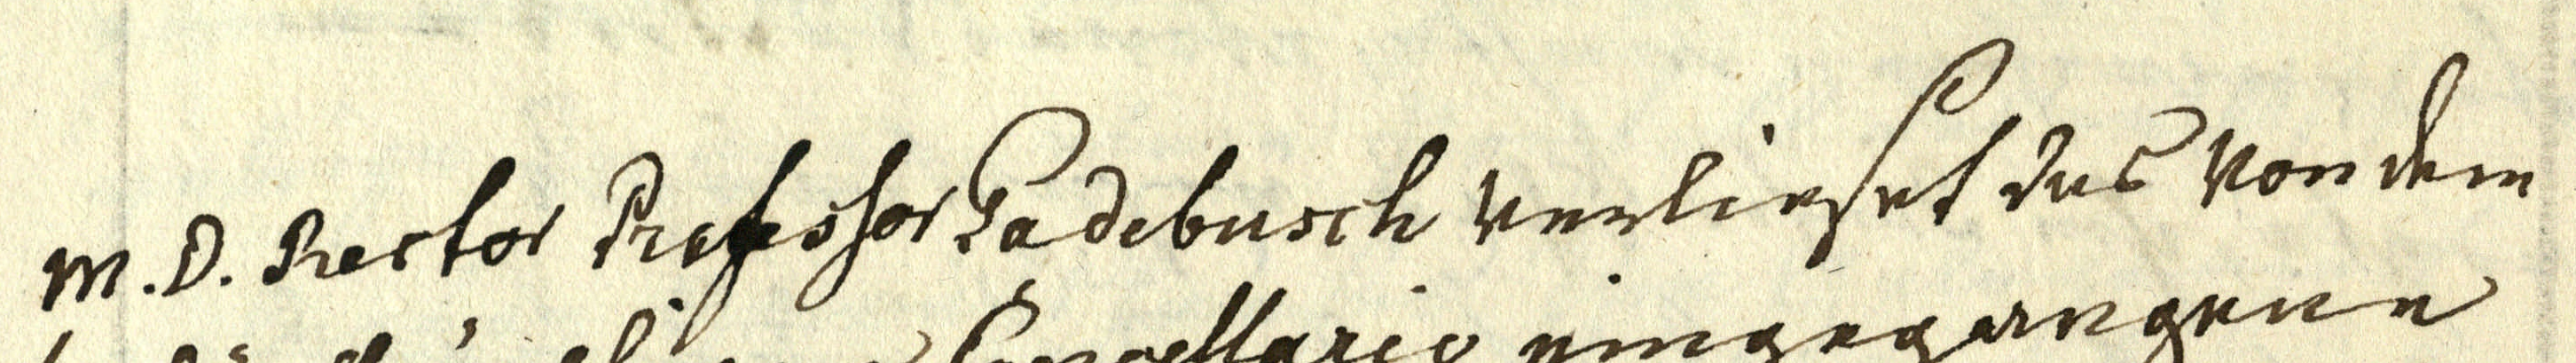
M. D. Rector Professor Gadebusch verlieset das von dem
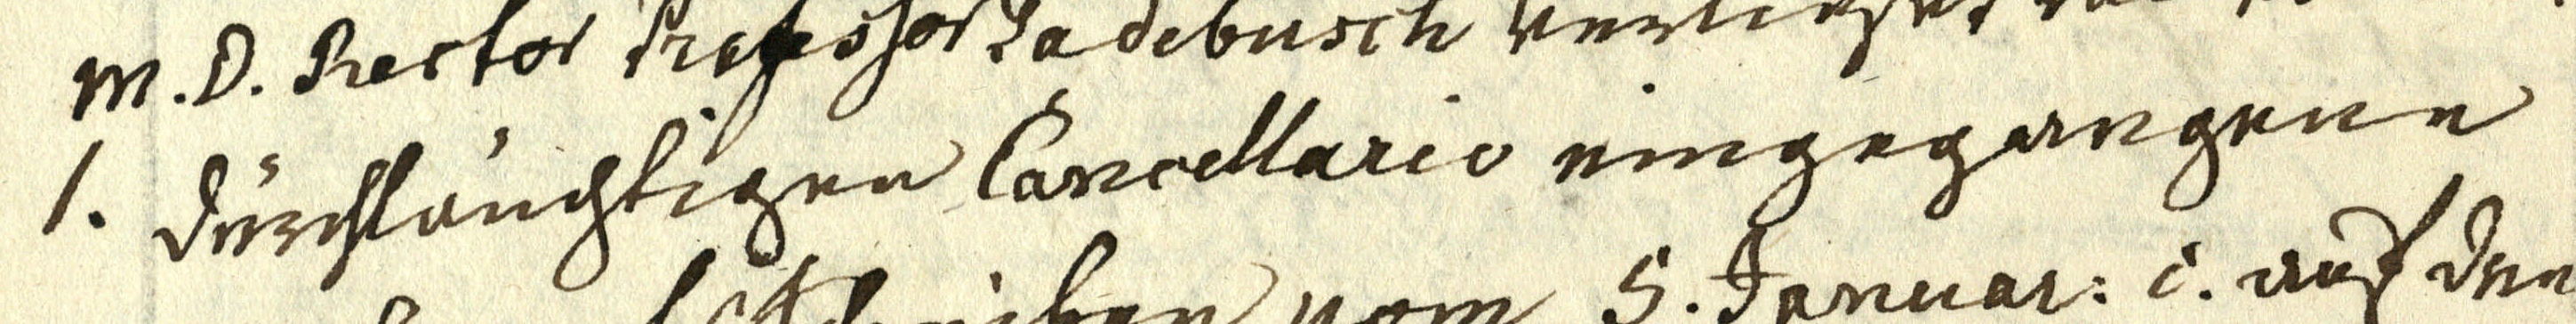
1. Durchlauchtigen Cancellario eingegangene
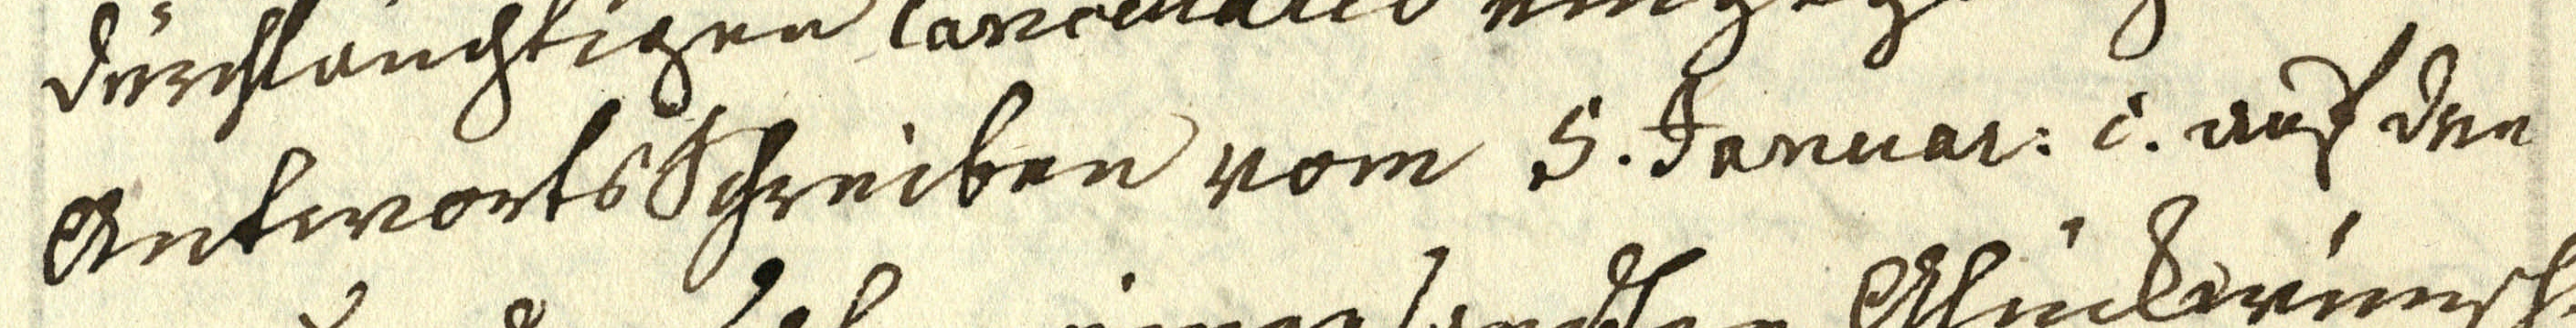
Antworts Schreiben vom 5. Januar c. auf den
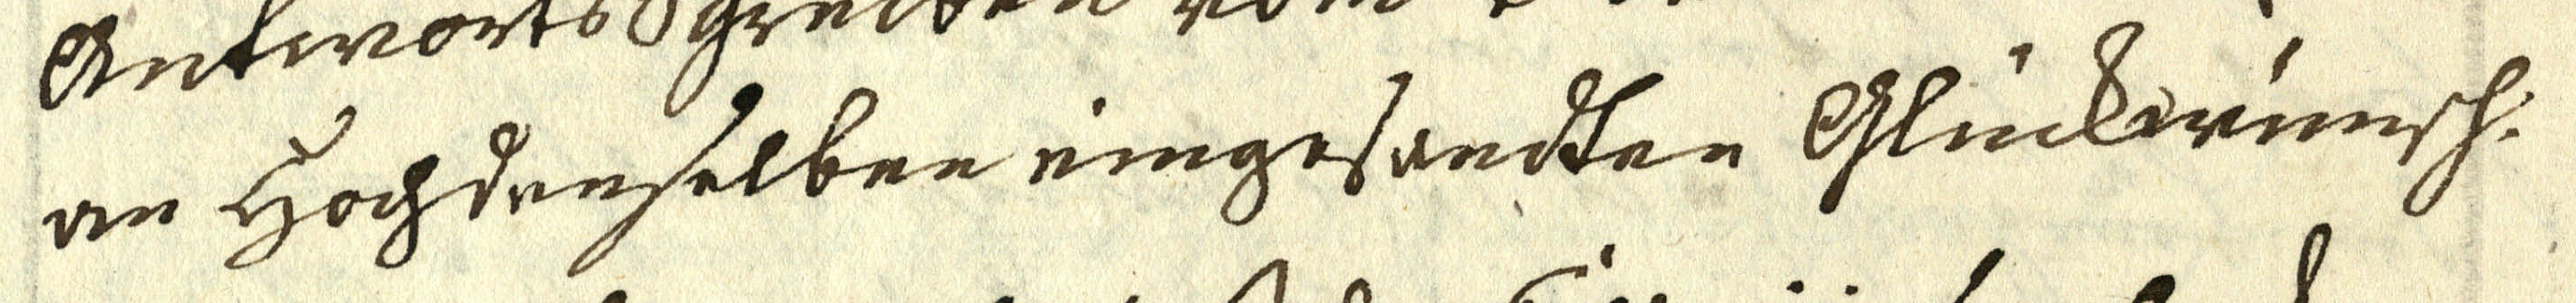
an Hochdenselben eingesandten Glückwunsch.
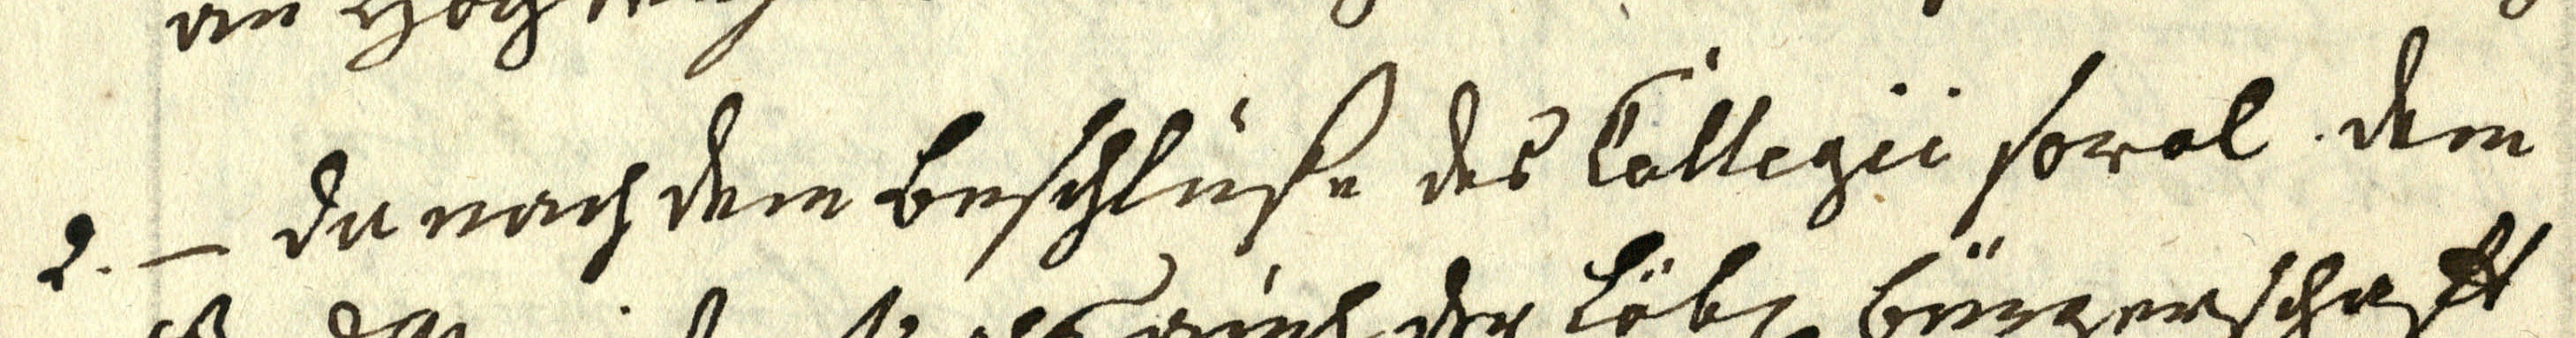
2. Da nach dem Beschluß des Collegii sowol dem
